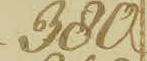380
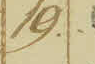19.
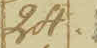24
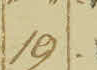19
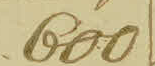600
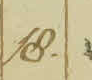18.
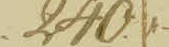240.
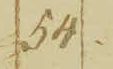54
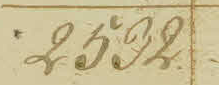2532.
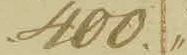400.
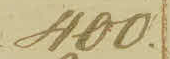400.
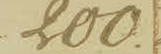200.
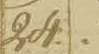24.
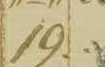19.
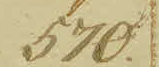570.
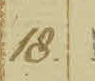18.
